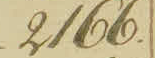2166.
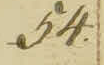54.
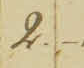2.
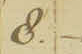8.
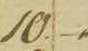10.
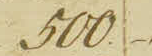500.
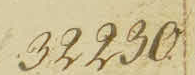32230.
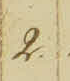2.
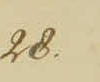32230.
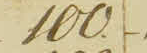100.
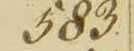583.
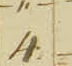4.
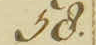58.
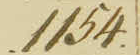1154.
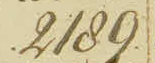2189.
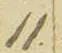11.
